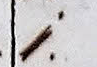1.
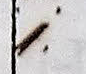1.
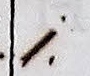1.
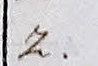2.
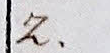2.
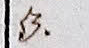3.
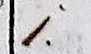1.
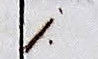1.
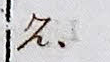2.
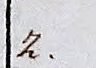2.
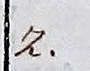2.
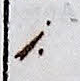1.
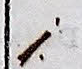1.
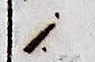1.
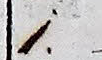1.
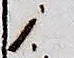1.
